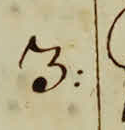3:
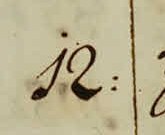12:
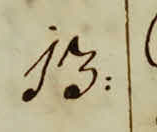13:
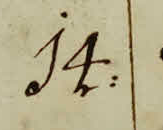14:
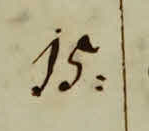15:
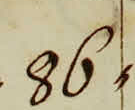86
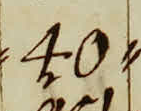40
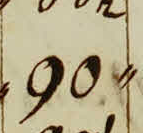90
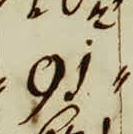91
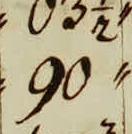90
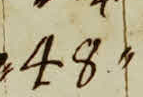48
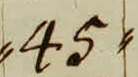45
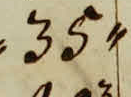35
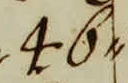46
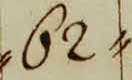62
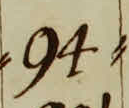94
